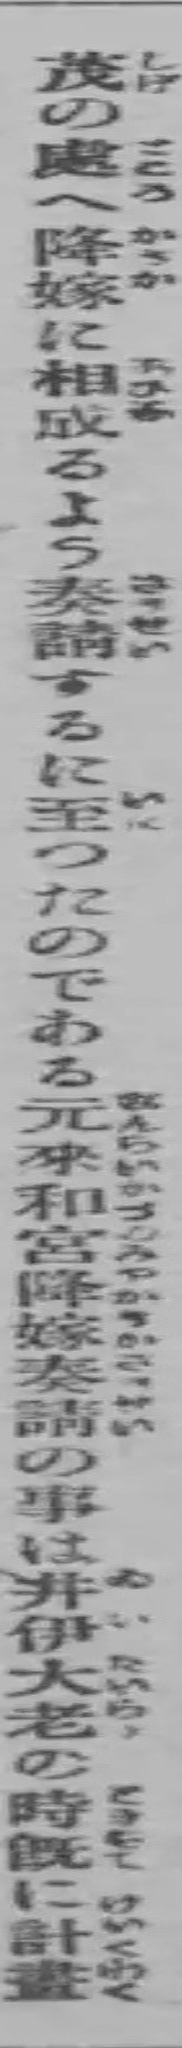和宮の降嫁茂の処へ降嫁に相成るよう奏請するに至つたのである元来和宮降嫁奏請の事は井伊大老の時既に計画
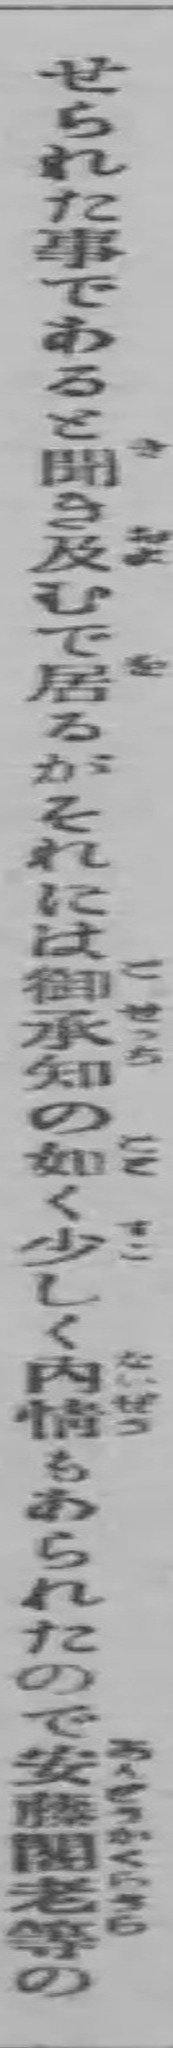せられた事であると聞き及むで居るがそれには御承知の如く少しく内情もあられたので安藤閣老等の
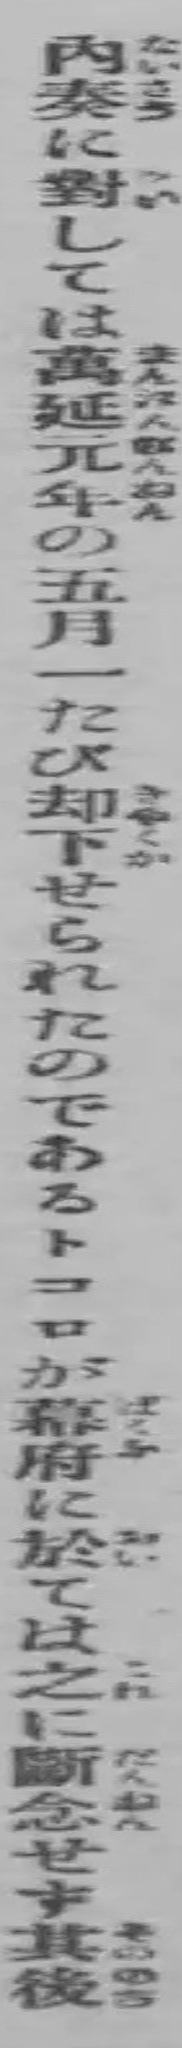内奏に対しては万延元年の五月一たび却下せられたのであるトコロが幕府に於ては之に断念せず其後
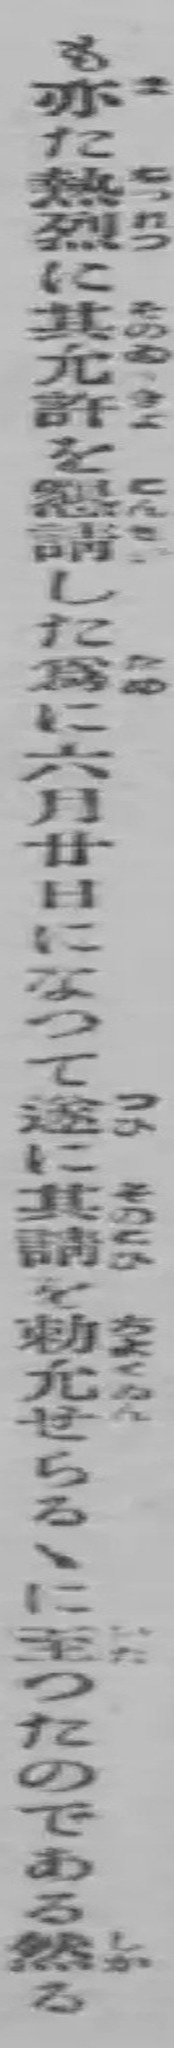も亦た熱烈に其允許を懇請した為に六月廿日になつて遂に其請を勅允せらるゝに至つたのである然る
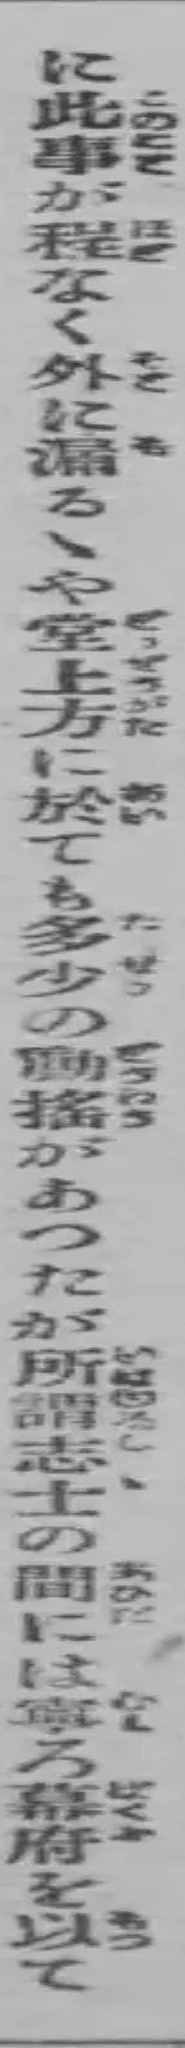に此事が程なく外に漏るゝや堂上方に於ても多少の動揺があつたが所謂志士の間には寧ろ幕府を以て
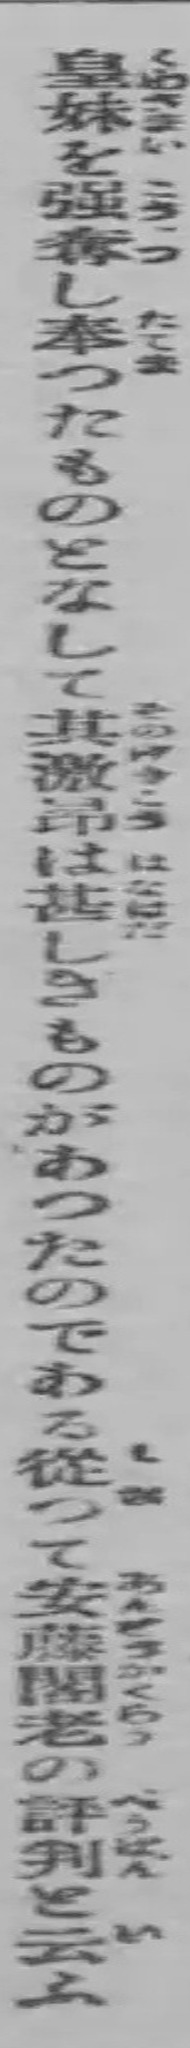皇妹を強奪し奉つたものとなして其激昂は甚しきものがあつたのである従つて安藤閣老の評判と云ふ
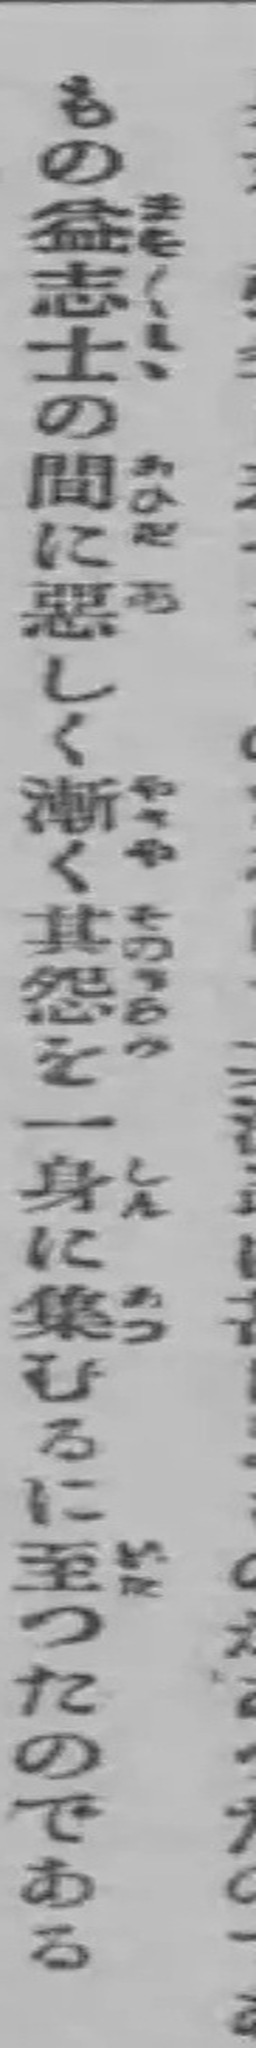もの益志士の間に悪しく漸く其怨を一身に集むるに至つたのである
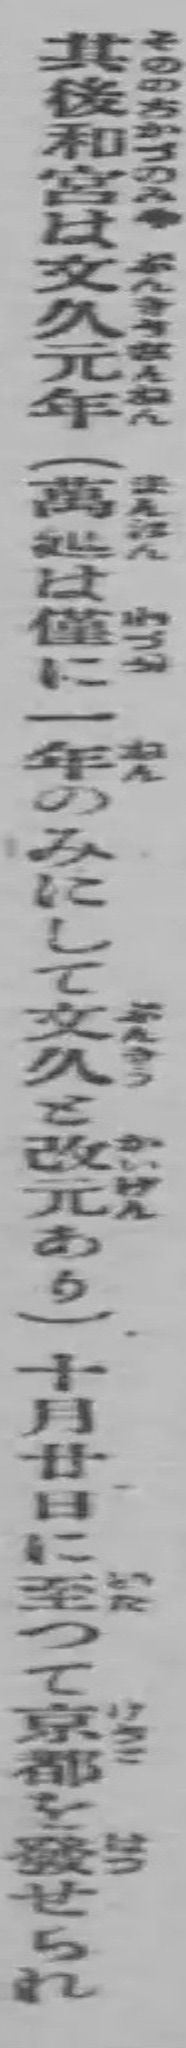其後和宮は文久元年(万延は僅に一年のみにして文久と改元あり)十月廿日に至つて京都を発せられ
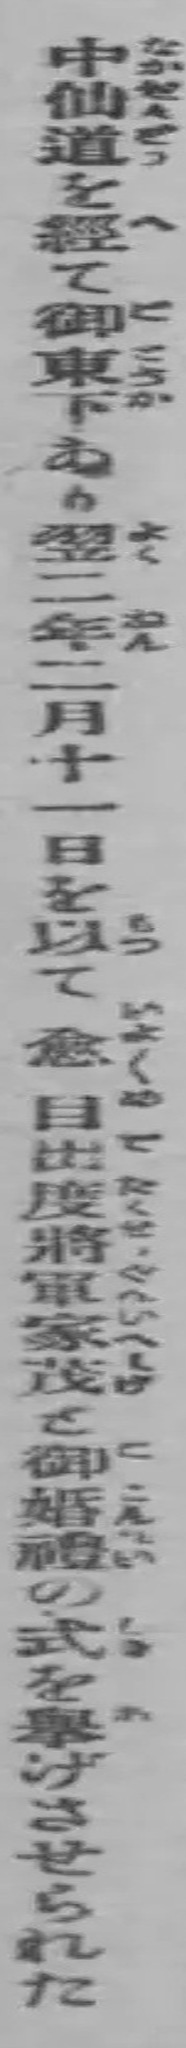中仙道を経て御東下あり翌二年二月十一日を以て愈目出度将軍家茂と御婚礼の式を挙げさせられた

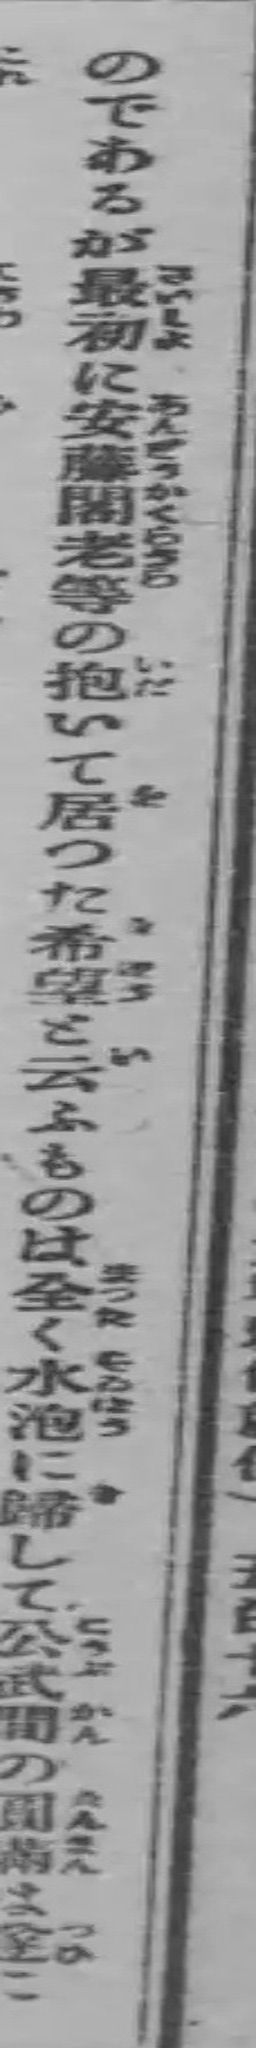のであるが最初に安藤閣老等の抱いて居つた希望と云ふものは全く水泡に帰して公武間の円満は遂に
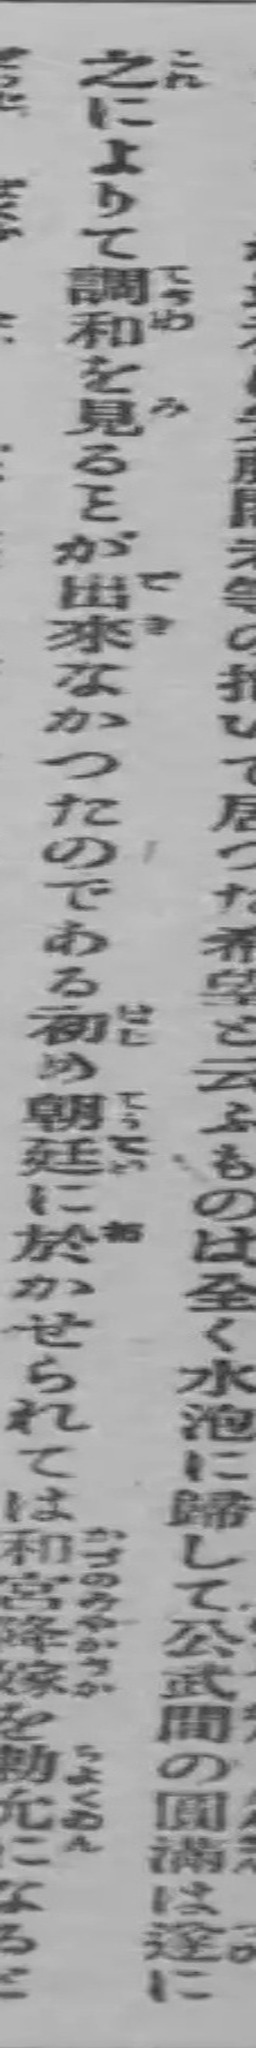之によりて調和を見ることが出来なかつたのである初め朝廷に於かせられては和宮降嫁を勅允になると
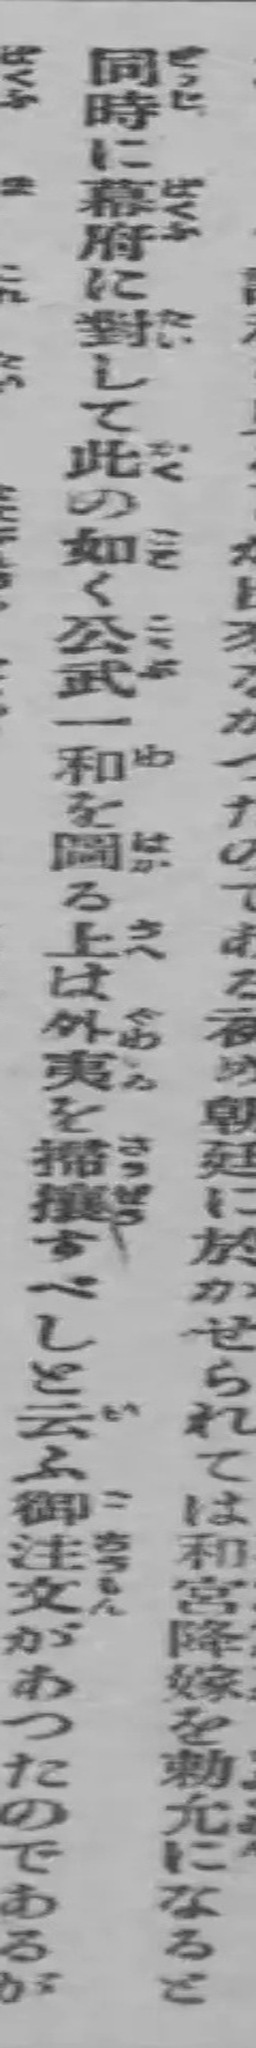同時に幕府に対して此の如く公武一和を図る上は外夷を掃攘すべしと云ふ御注文があつたのであるが
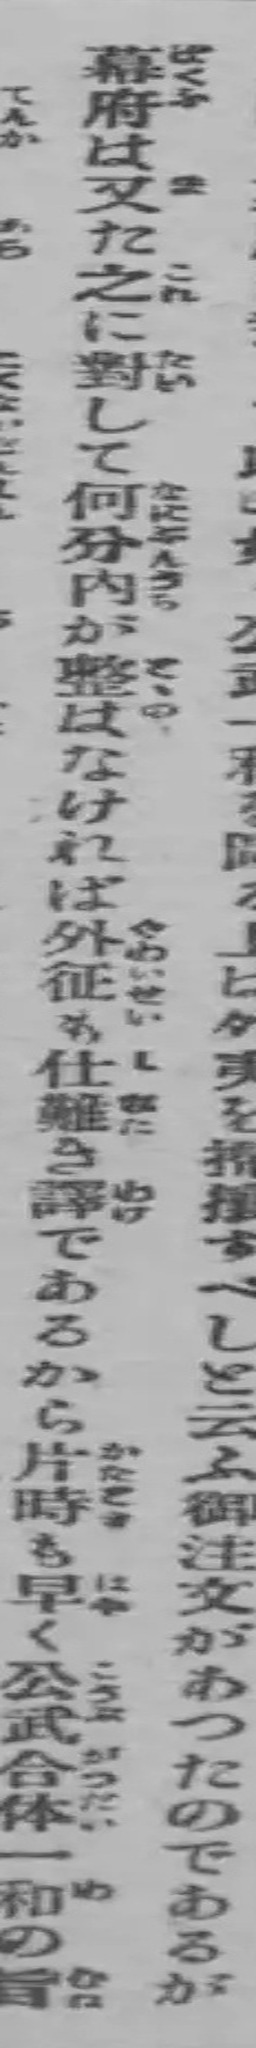幕府は又た之に対して何分内が整はなければ外征も仕難き訳であるから片時も早く公武合体一和の旨
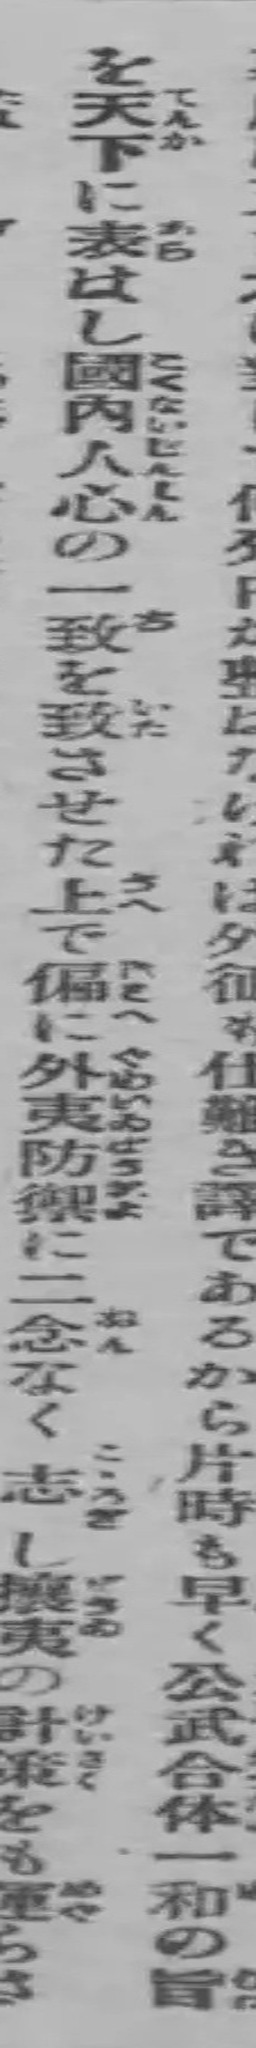を天下に表はし国内人心の一致を致させた上で偏に外夷防禦に二念なく志し攘夷の計策をも運らさ
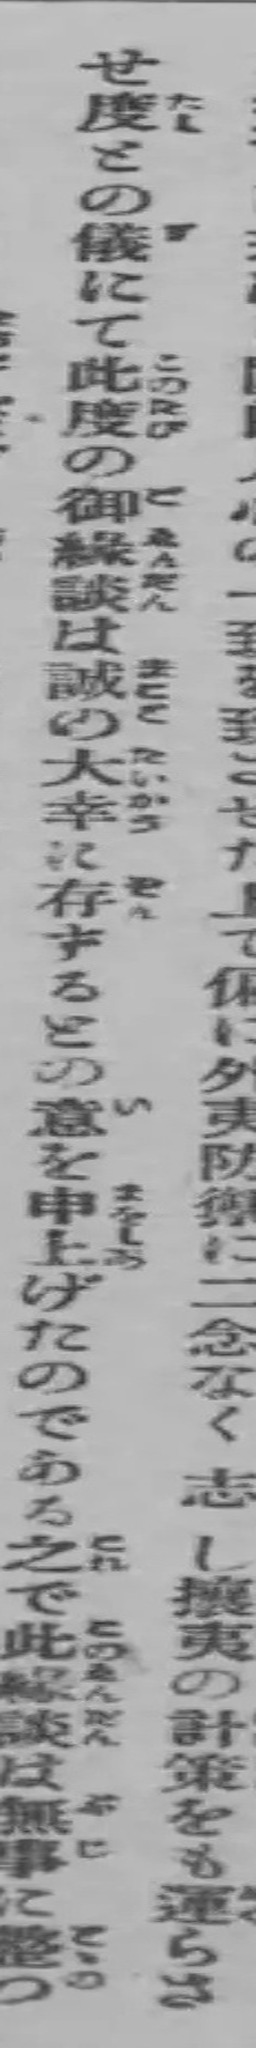せ度との儀にて此度の御縁談は誠にの大幸に存ずるとの意を申上げたのである之で此縁談は無事に整つ
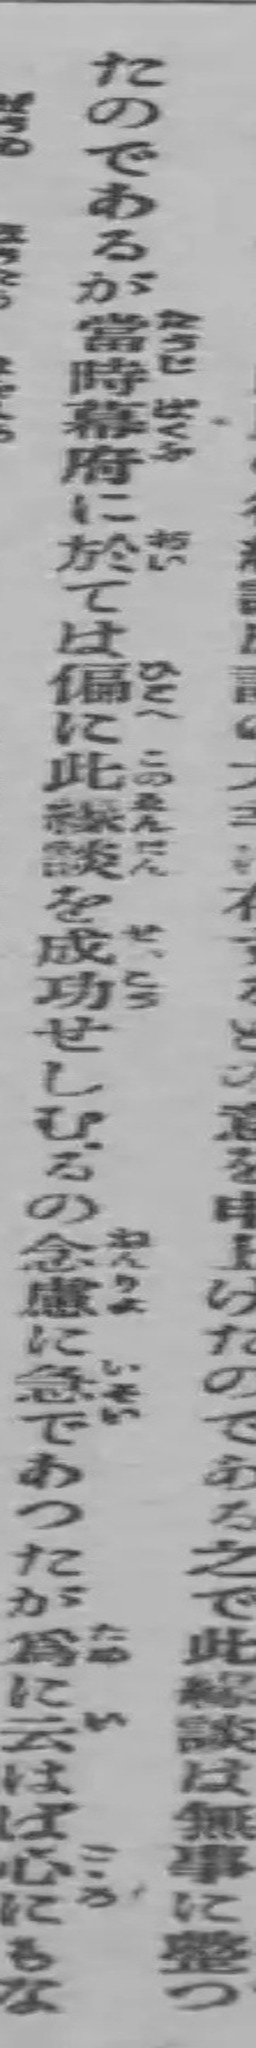たのであるが当時幕府に於ては偏此縁談を成功せしむるの念慮に急であつたが為に云はば心にもな
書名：豊橋市史談
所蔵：国立国会図書館 National Diet Library, JAPAN
